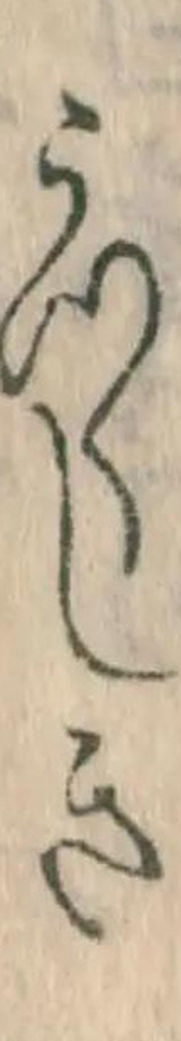うつくしき
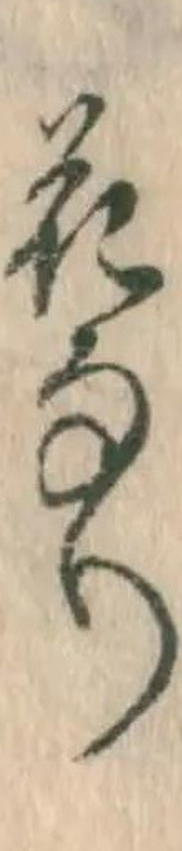花なり
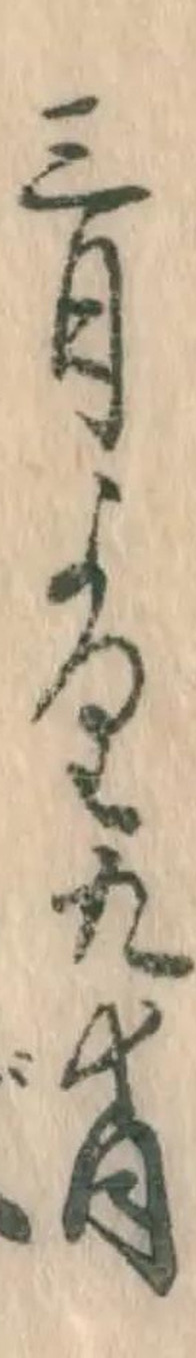三月より九十月
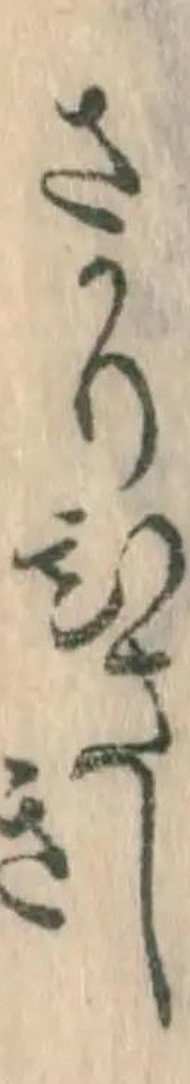さかりひさしき

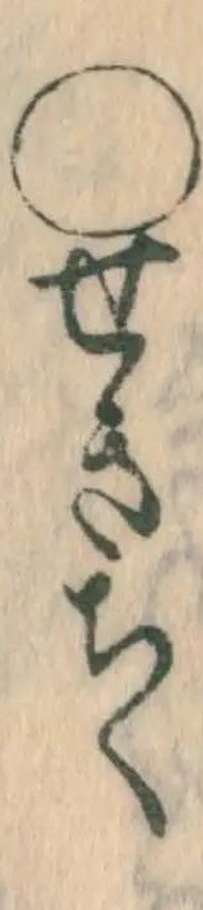〇せきちく
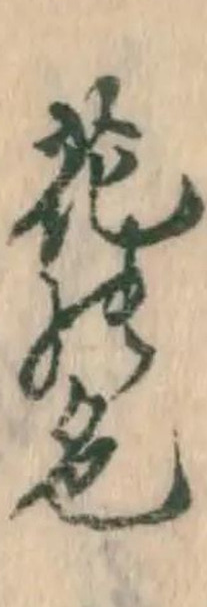花の色
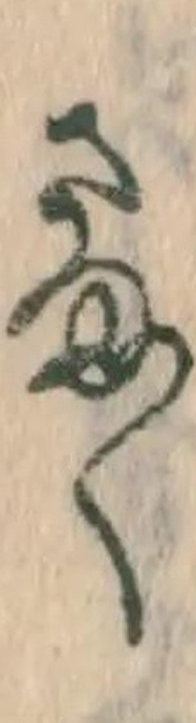さま〳〵
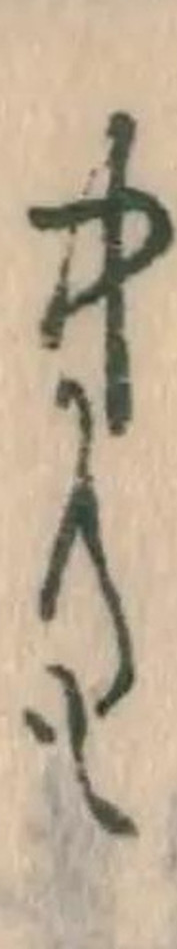中にも
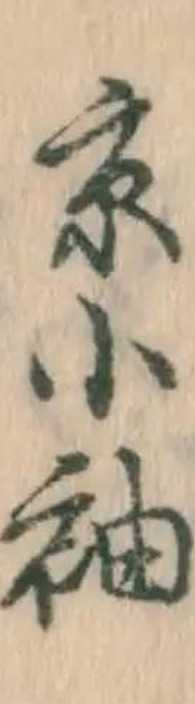京小袖
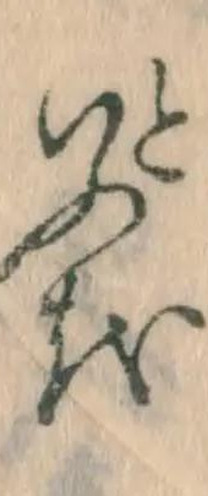いふを
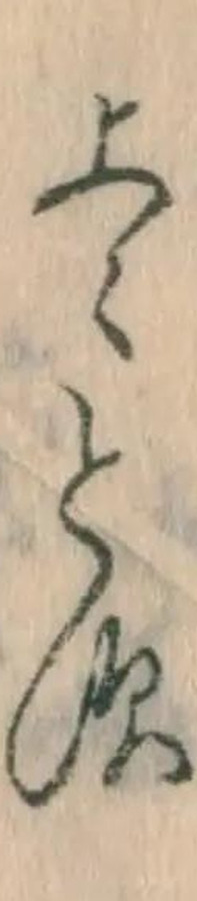上々とす
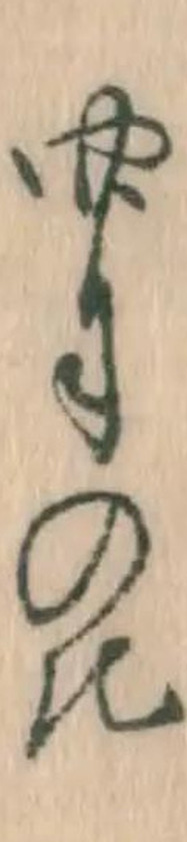四月の比
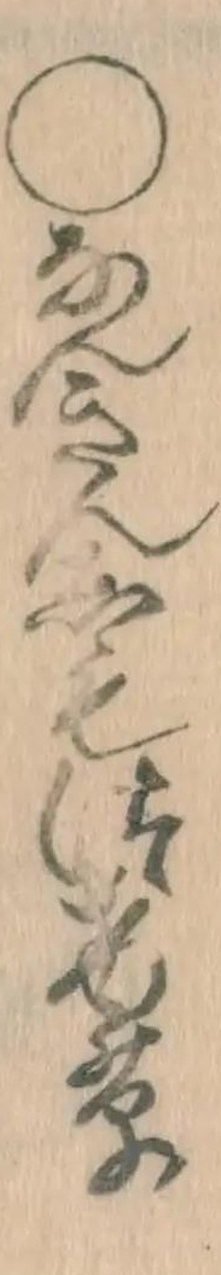〇なんきんしもつけ草

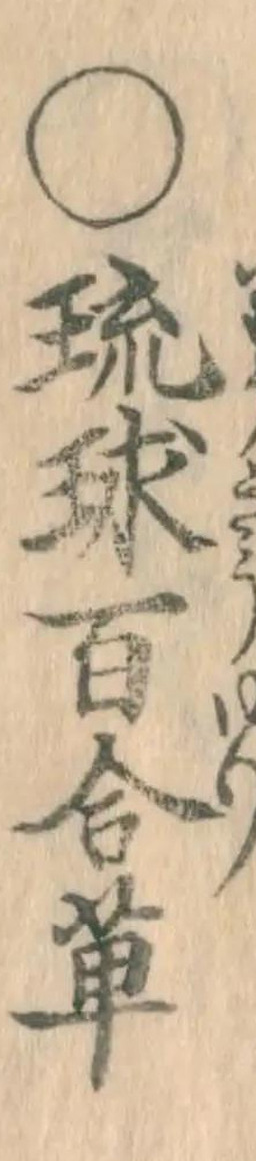〇琉球百合草
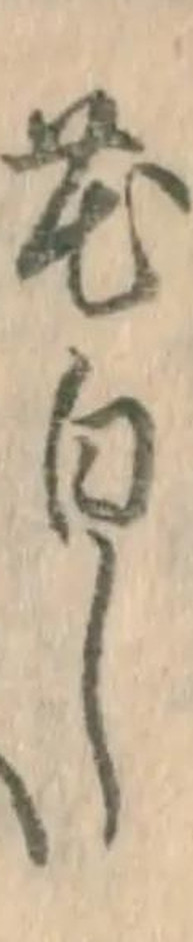花白く
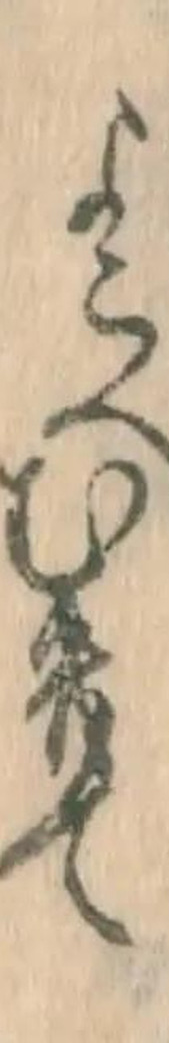よこへむきて
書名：艸花繪前集. [1]
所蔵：国立国会図書館 National Diet Library, JAPAN
